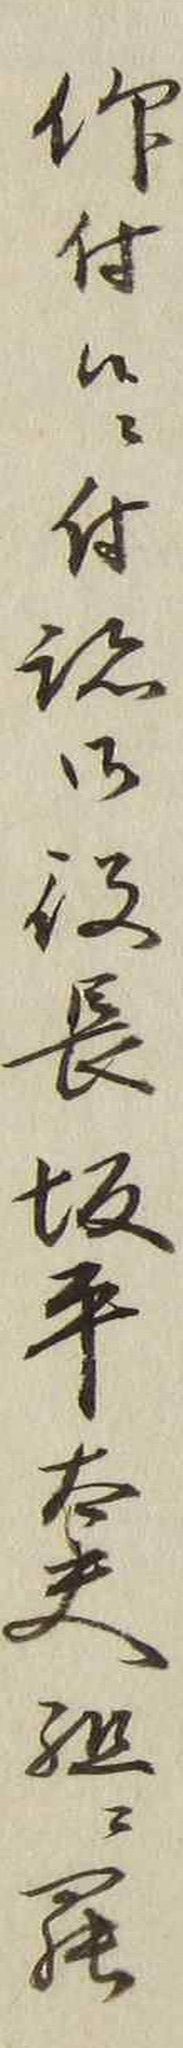仰付候ニ付跡御役長坂平太夫組ニ罷

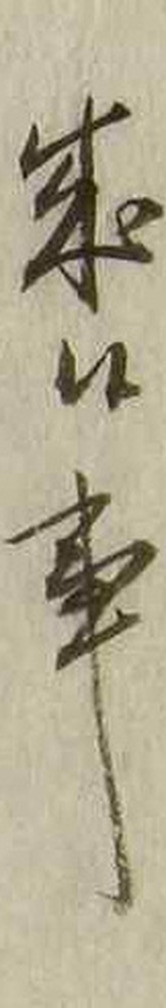成候事
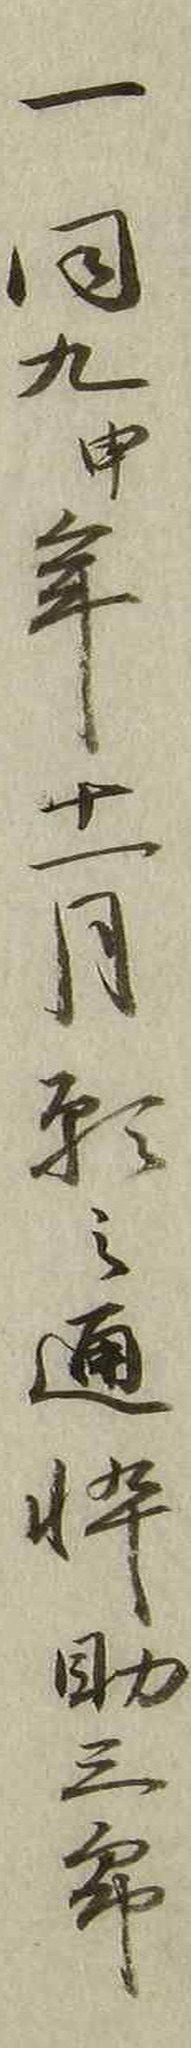一同九申年十一月願之通忰助三郎
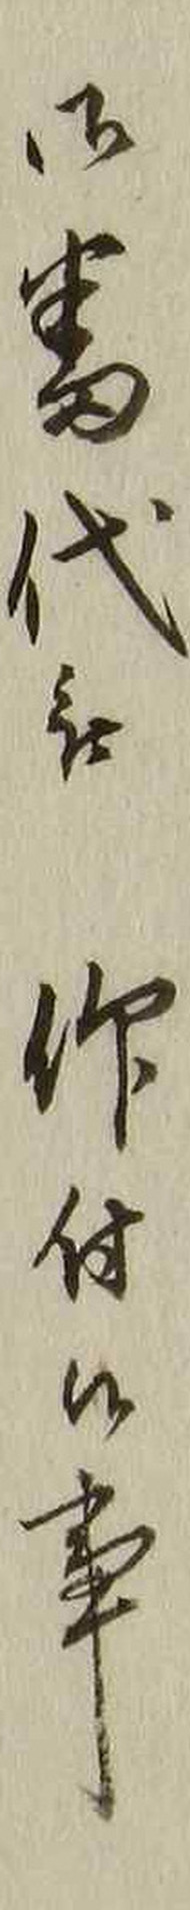御番代被仰付候事
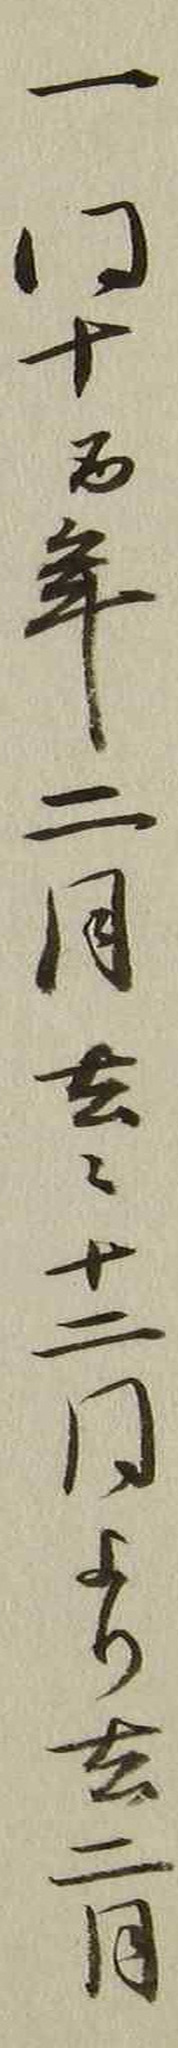一同十酉年二月去々十二月より去二月
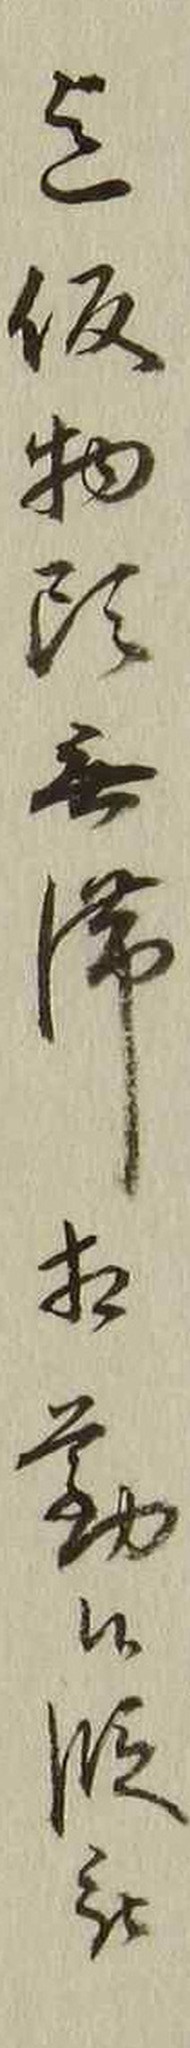迄仮物頭無滞相勤候段被
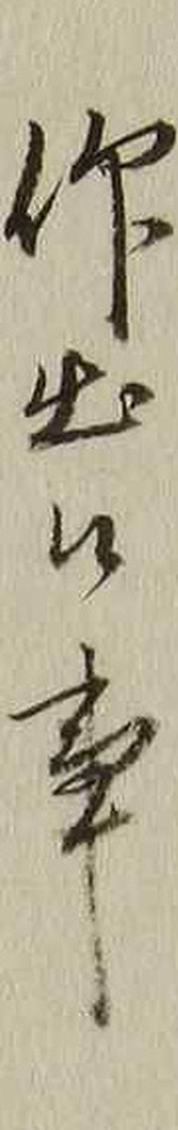仰出候事
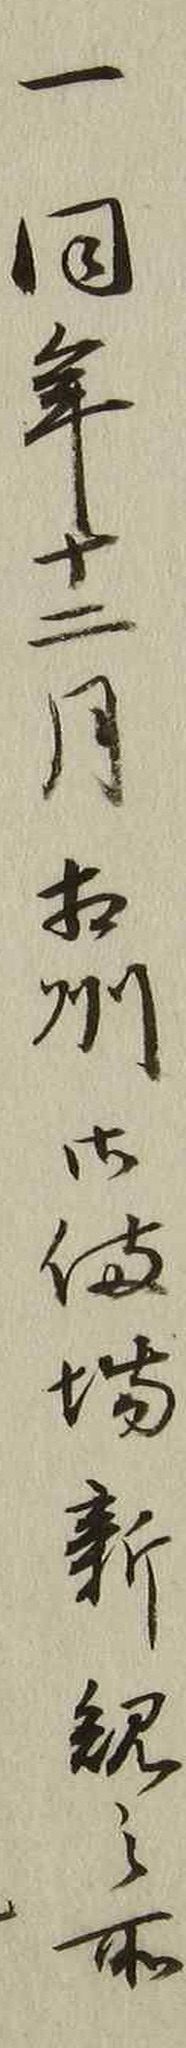一同年十二月相州御備場新規之所
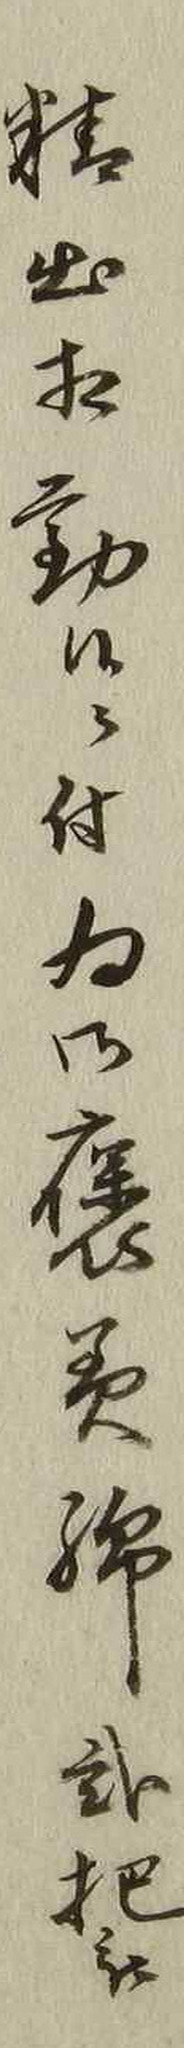精出相勤候ニ付為御褒美綿弐把被
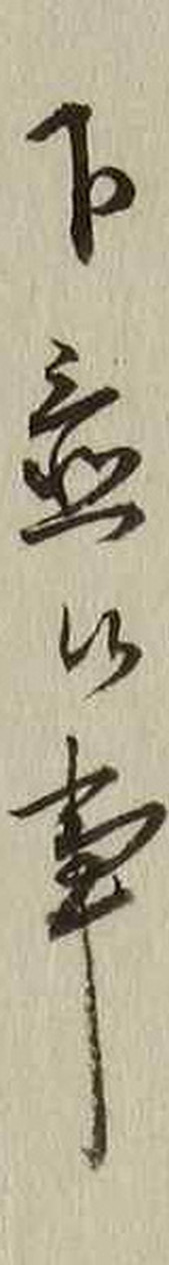下置候事
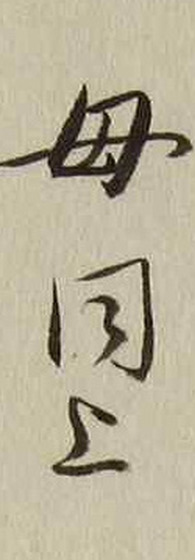母同上
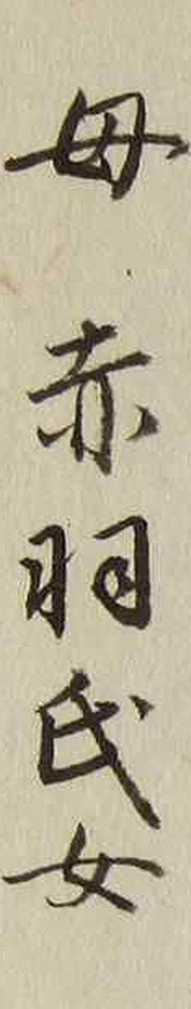母赤羽氏女
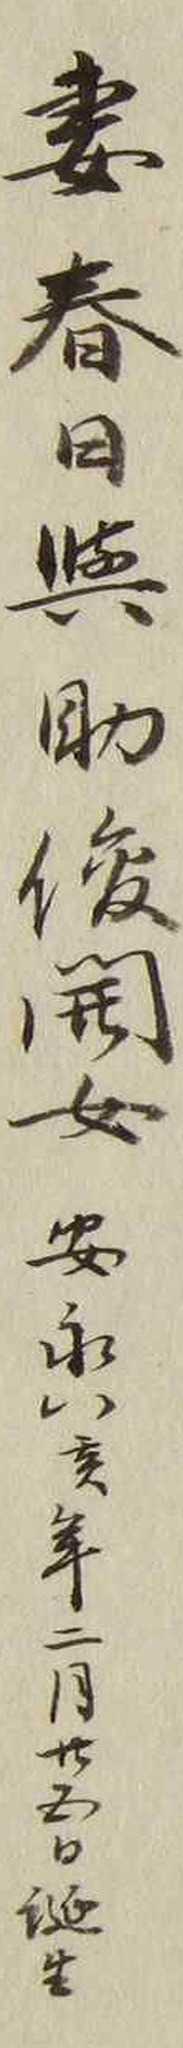妻春日與助俊開女安永八亥年二月廿五日誕生

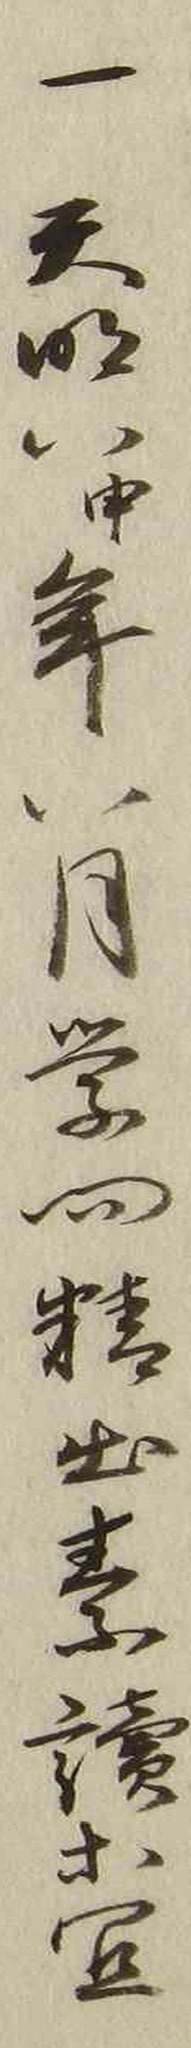一天明八申年八月学問精出素読等宜
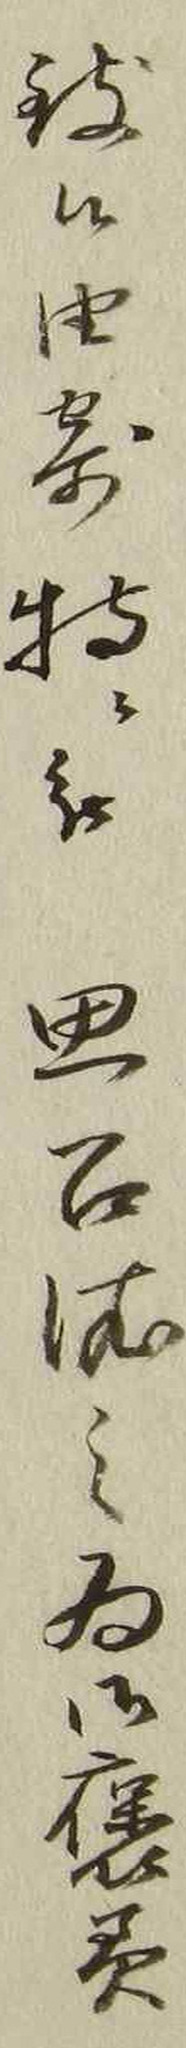致候由寄特ニ被思召依之為御褒美
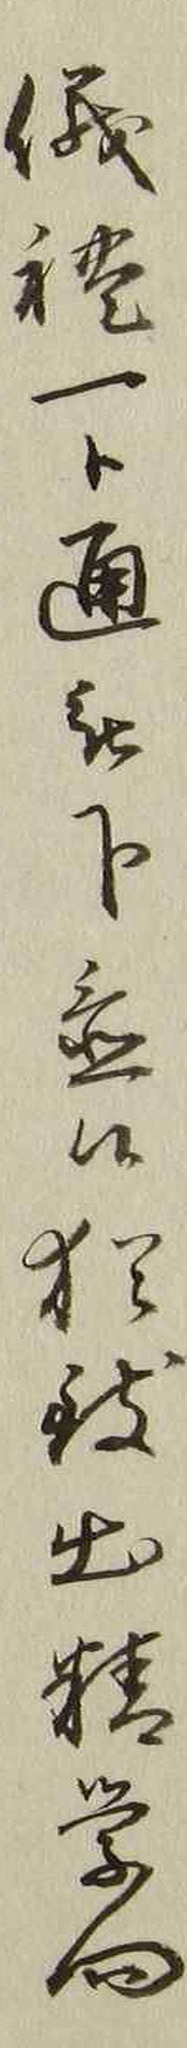儀礼一ト通被下置候猶致出精学問
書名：諸士系譜　巻之128　た之部4
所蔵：会津若松市立会津図書館
